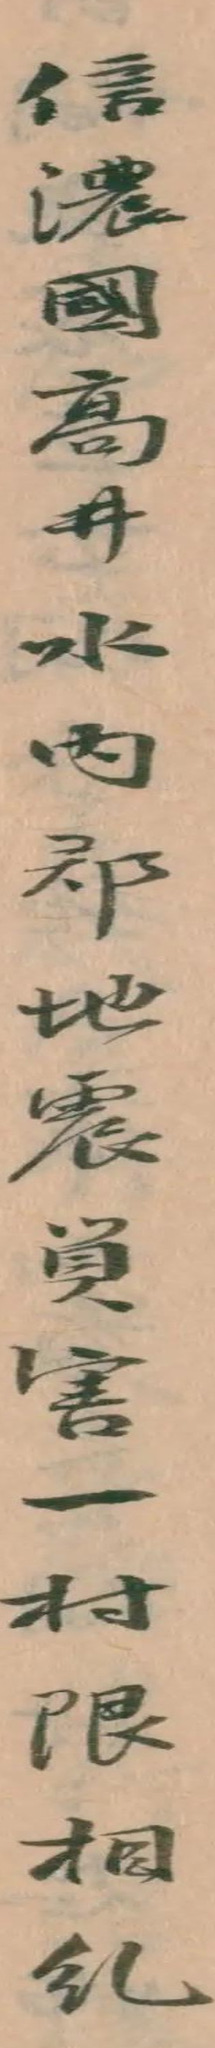信濃国高井水内郡地震災害一村限相糺
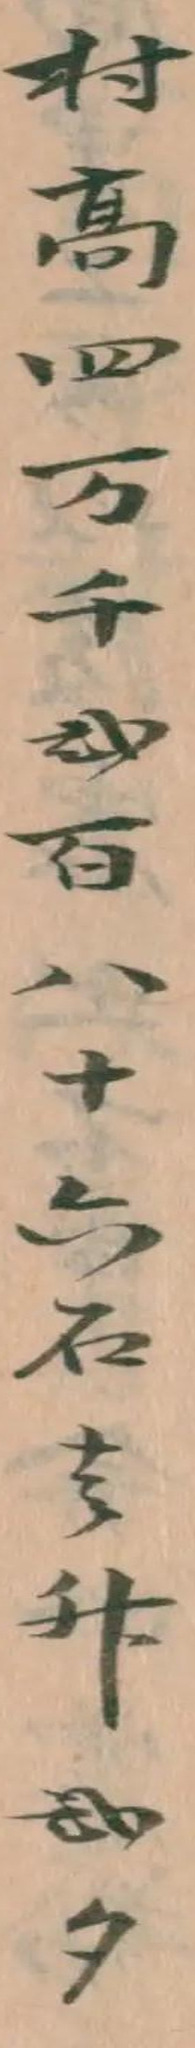村高四万千弐百八十六石壱升弐勺
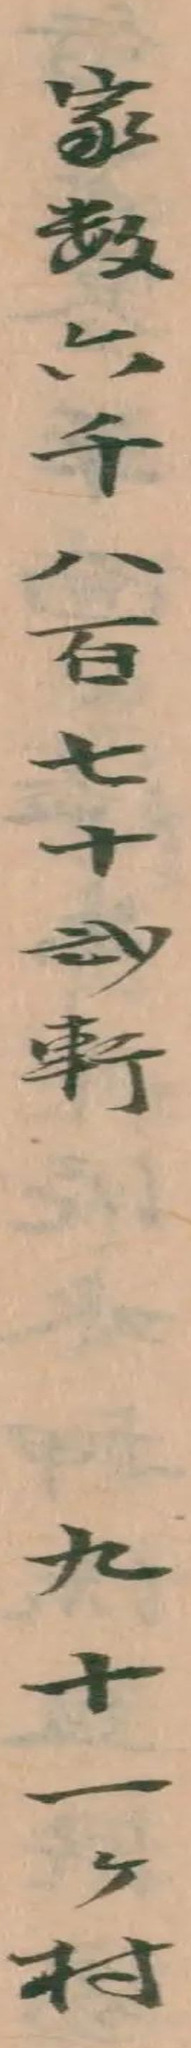家数六千八百七十弐軒九十一ヶ村
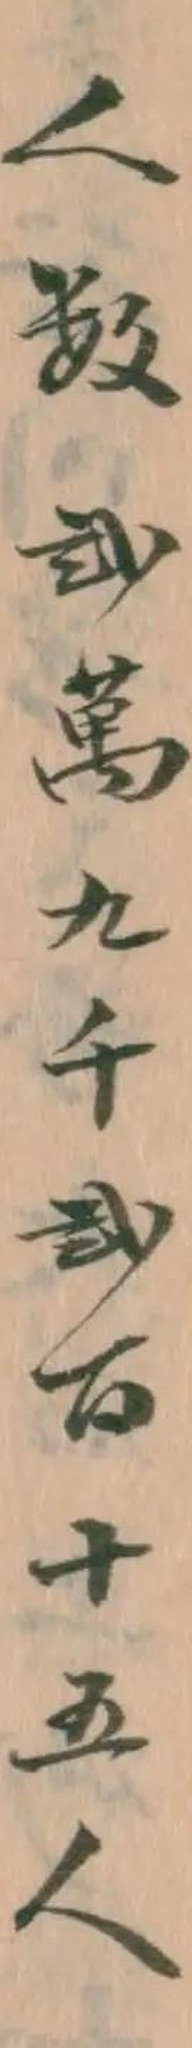人数弐万九千弐百十五人
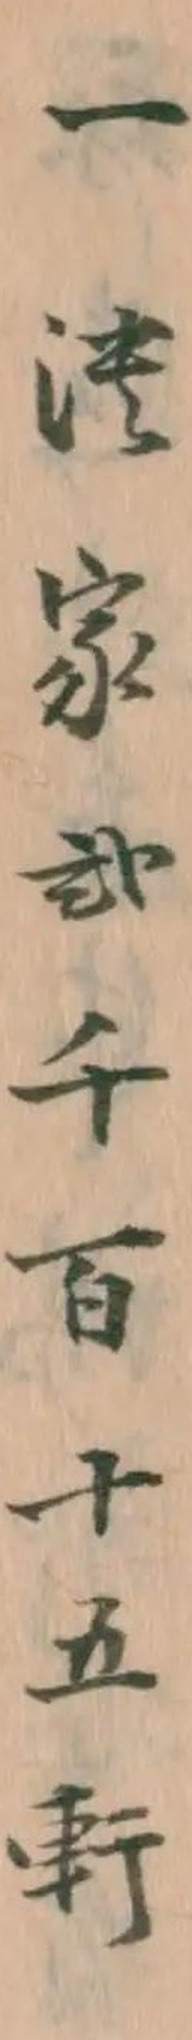一潰家弐千百十五軒
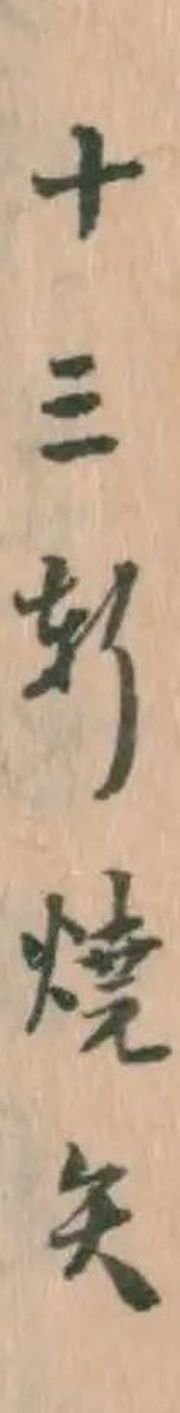内十三軒焼失
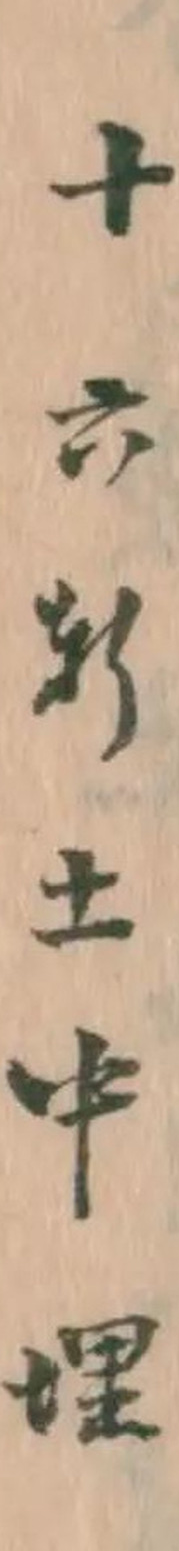十六軒土中埋
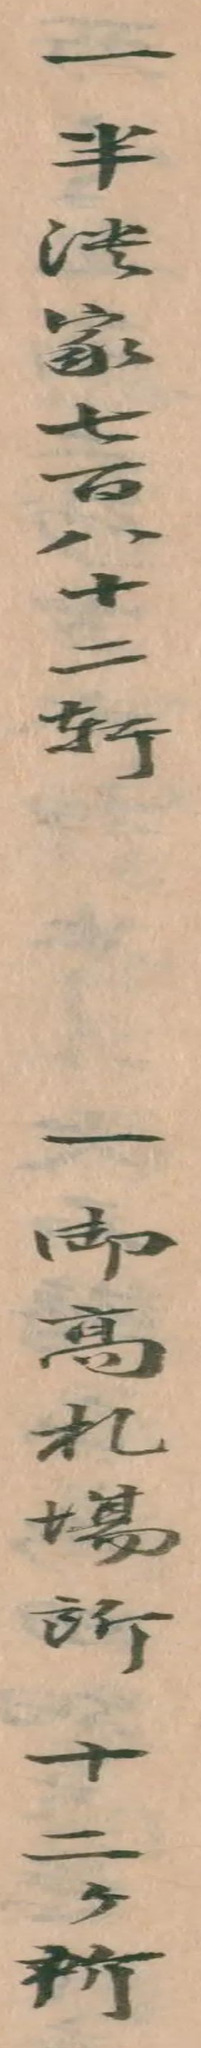一半潰家七百八十二軒一御高札場十二ヶ所
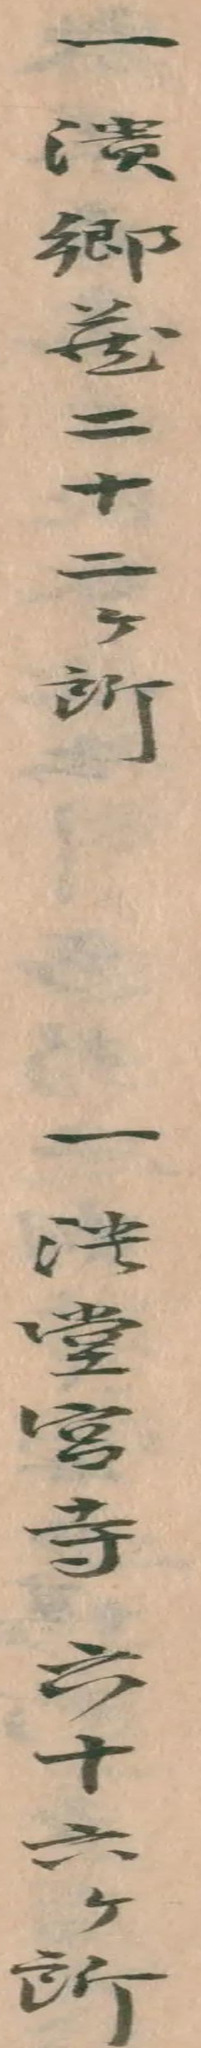一潰郷蔵二十二ヶ所一潰堂宮寺六十六ヶ所
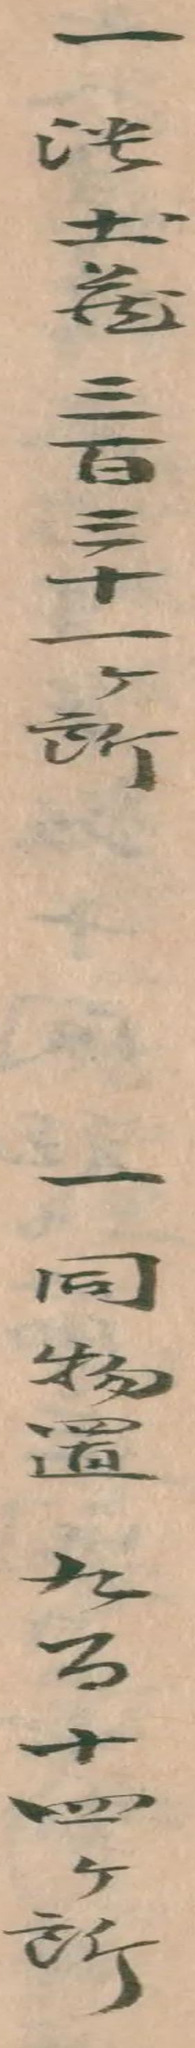一潰土蔵三百三十一ヶ所一同物置九百十四ヶ所
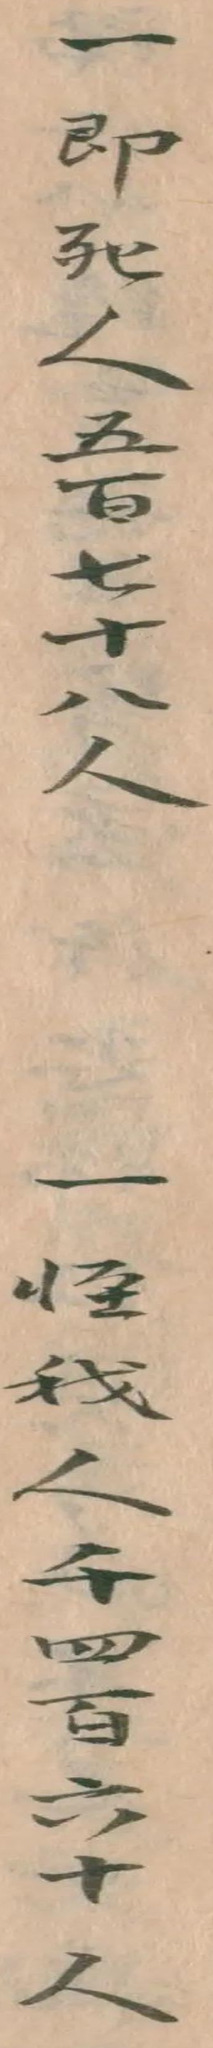一即死人五百七十八人一怪我人千四百六十人
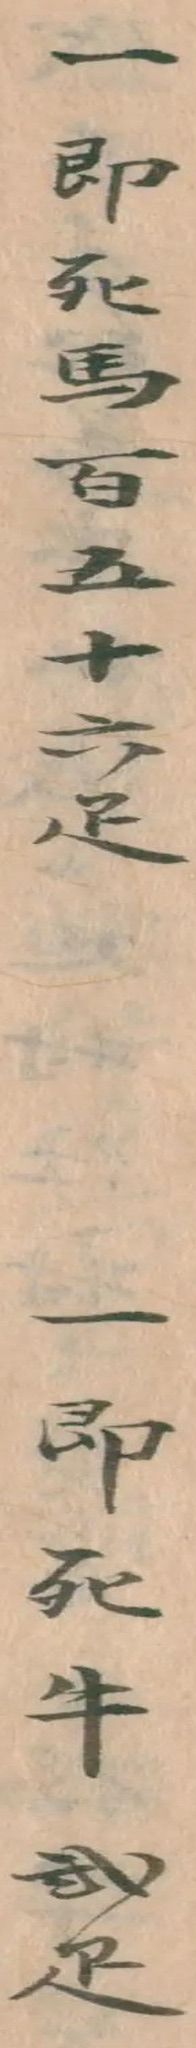一即死馬百五十六疋一即死牛弐疋
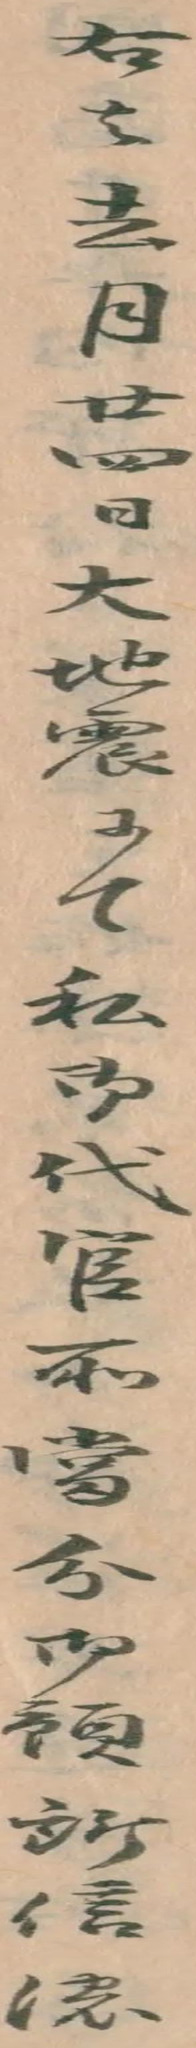右者去月廿四日大地震にて私御代官所当分御預所信濃

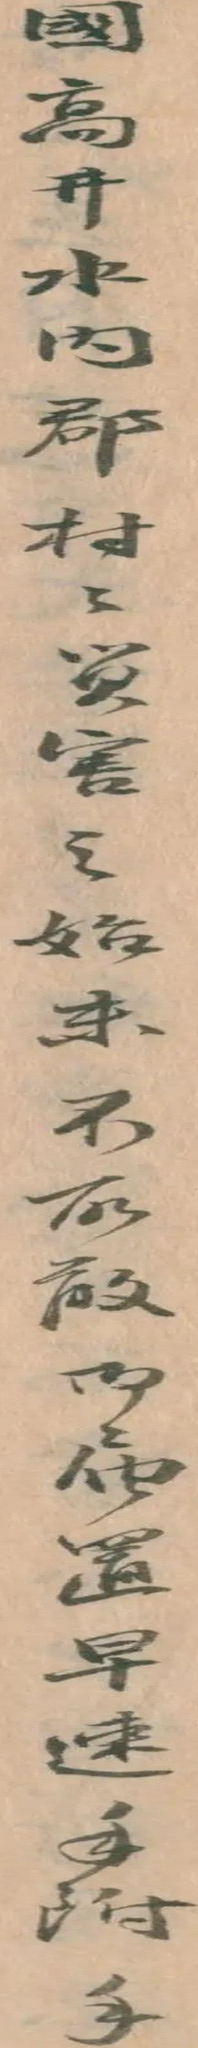国高井水内郡村々災害之始末不取敢御届置早速手附手
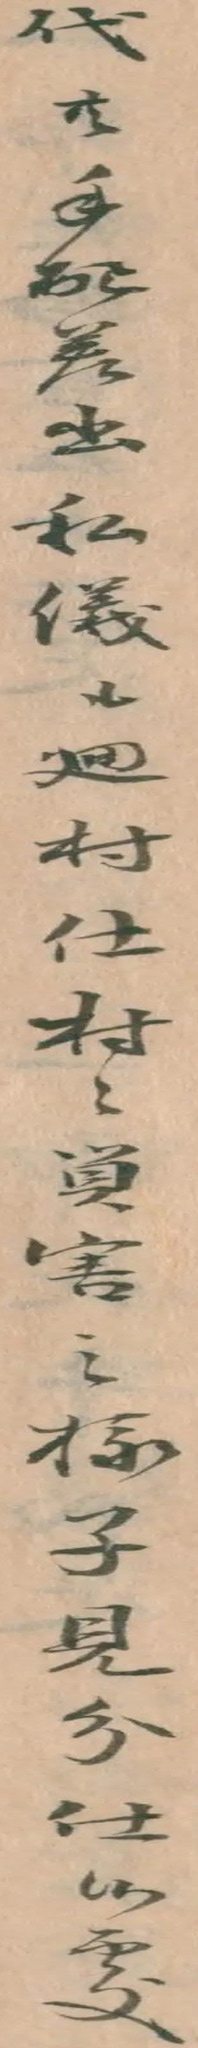代共手配差出私儀も廻村仕村々災害之様子見分仕候処
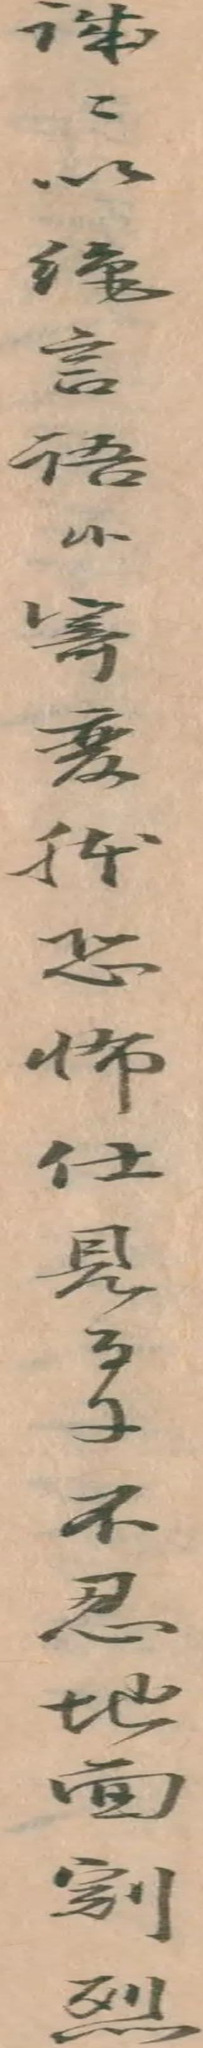誠二以絶言語候奇変之躰恐怖仕見るに不忍地面割裂
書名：地災撮要. 巻3(地震之部)-巻4(噴火之部)
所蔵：国立国会図書館 National Diet Library, JAPAN
